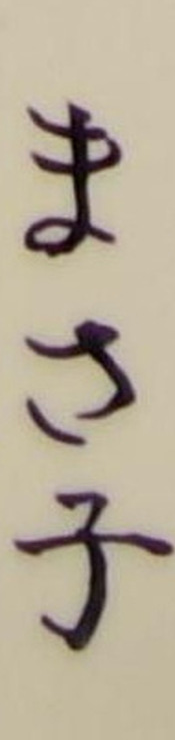まさ子
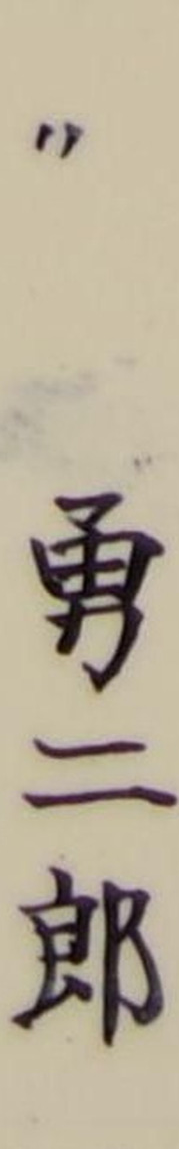勇二郎
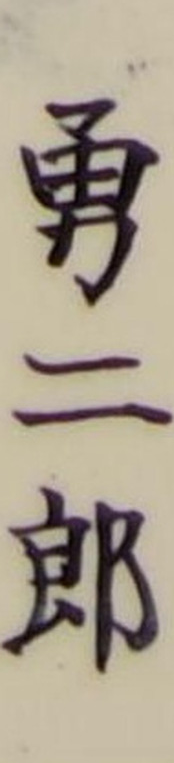勇二郎
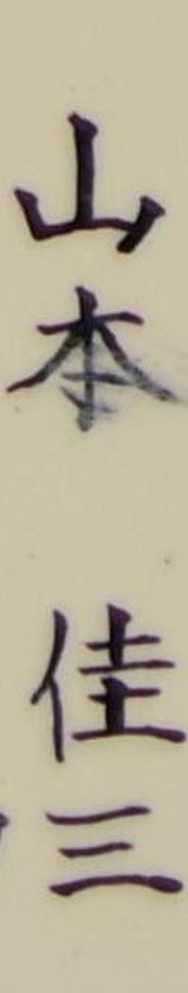山本佳三
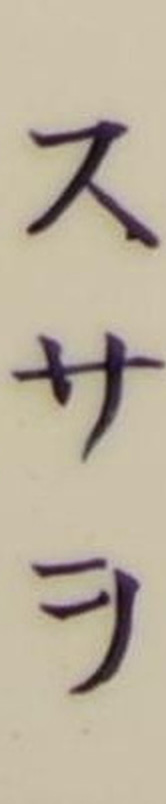スサヲ

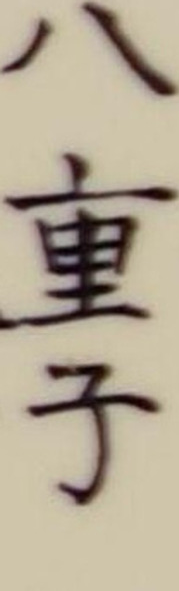八重子
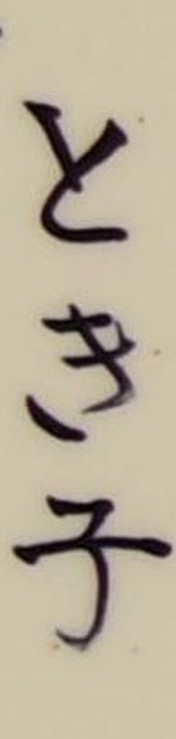とき子
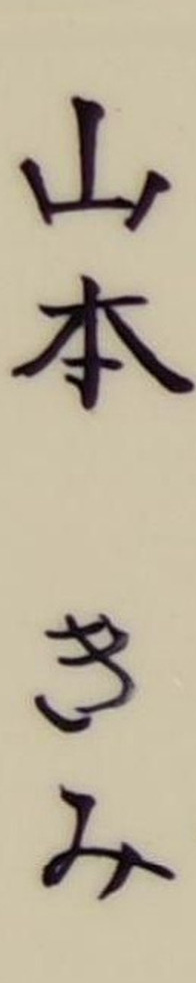山本きみ
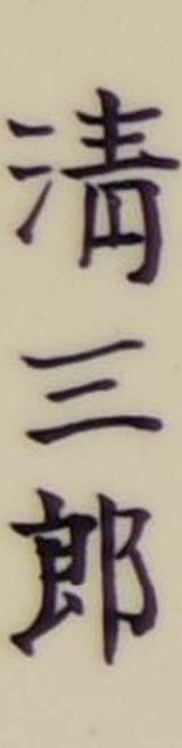清三郎

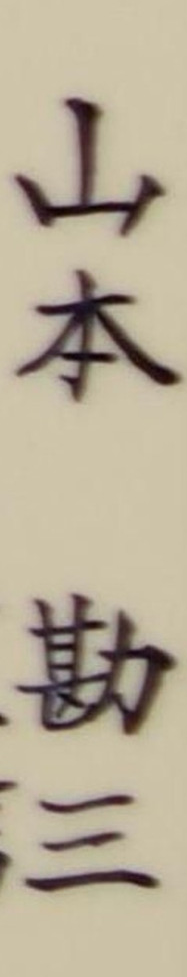山本勘三
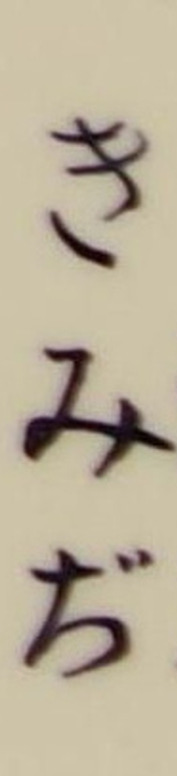きみぢ
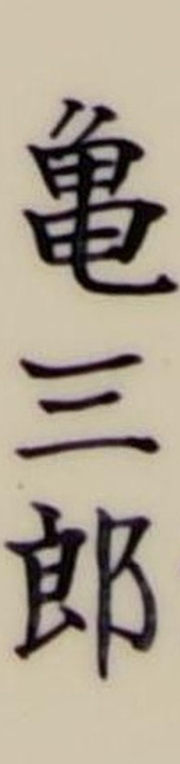亀三郎
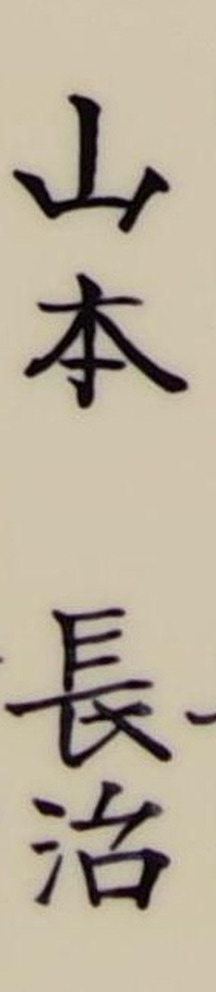山本長治
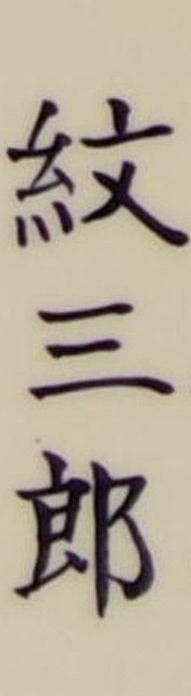紋三郎
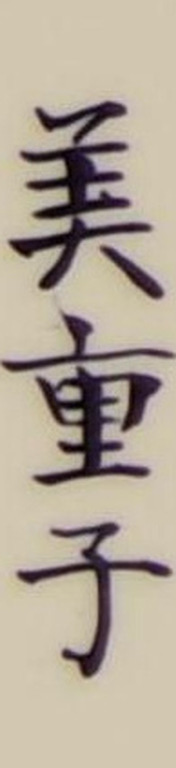美重子

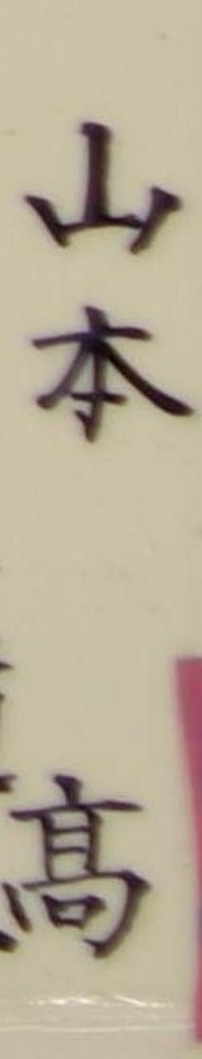山本高
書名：A~D
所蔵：koyasan kongobuji
